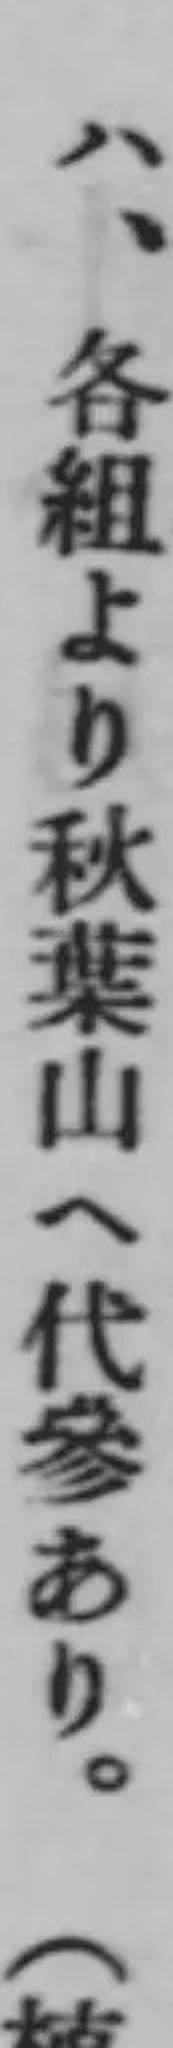ハ、各組より秋葉山へ代參あり。(植田)
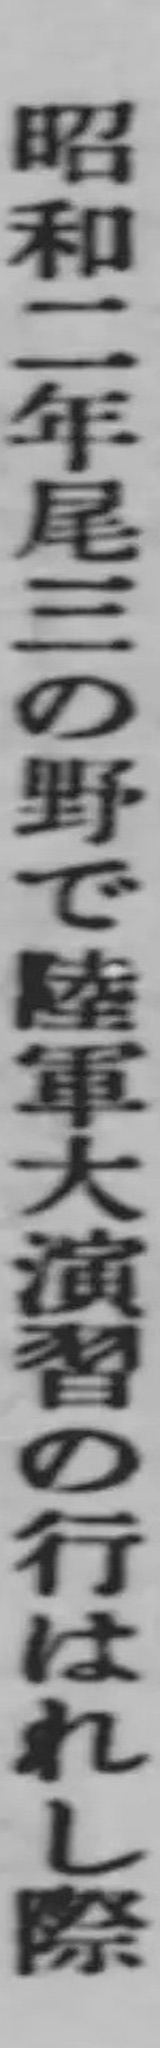昭和二年尾三の野で陸軍大演習の行はれし際
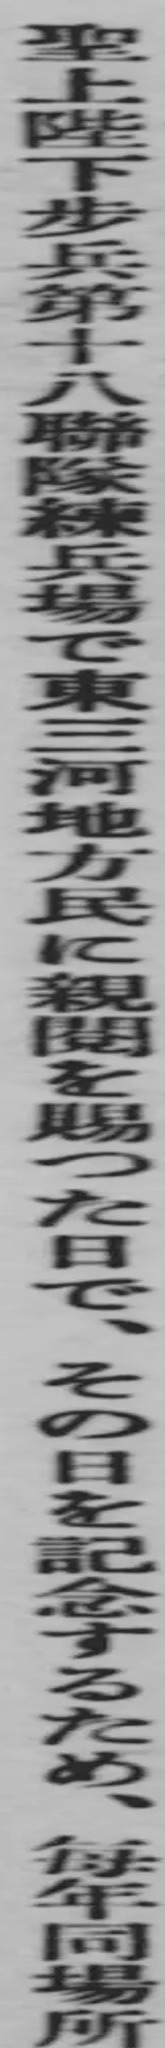聖上陛下歩兵第十八聯隊練兵場で東三河地方民に親閱を賜つた日で、その日を記念するため、每年同場所
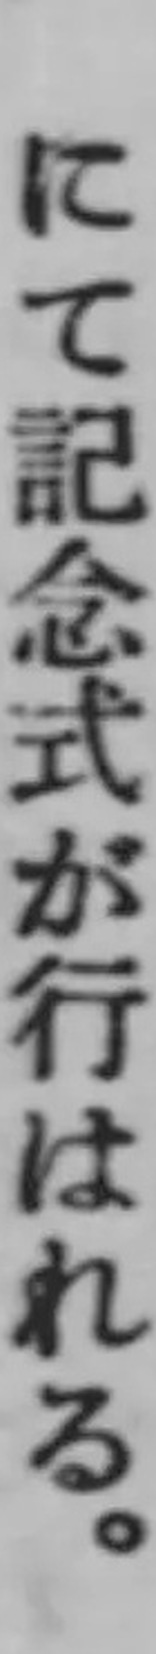にて記念式が行はれる。
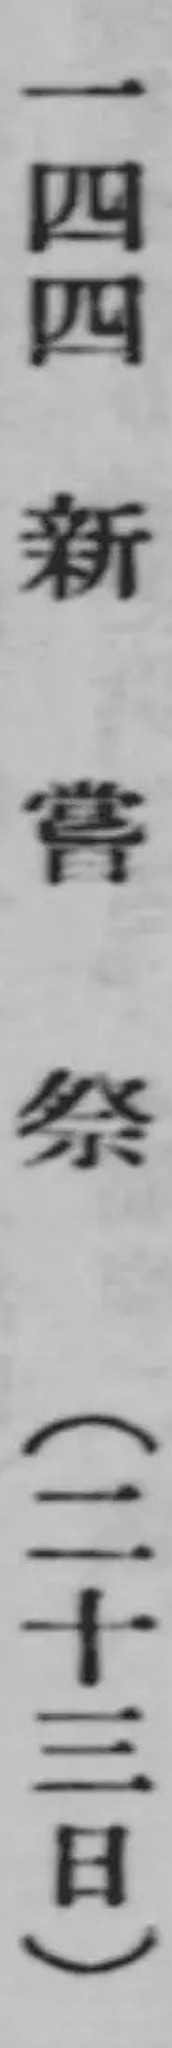一四四新嘗祭(二十三日)
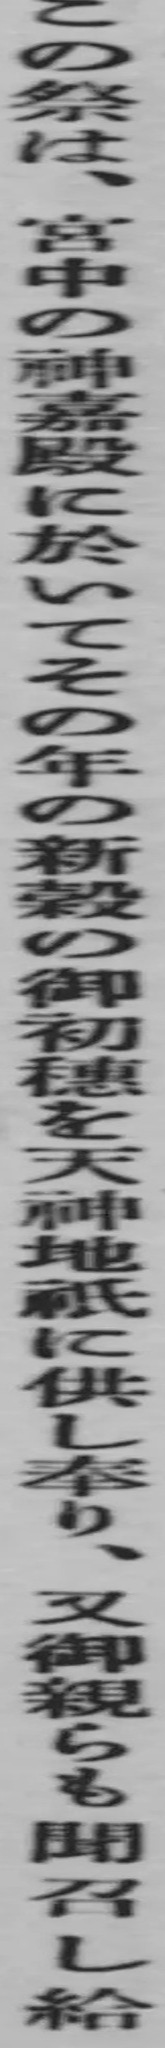この祭は、宮中の神嘉殿に於いてその年の新穀の御初穗を天神地祇に供し奉り、又御親らも聞召し給
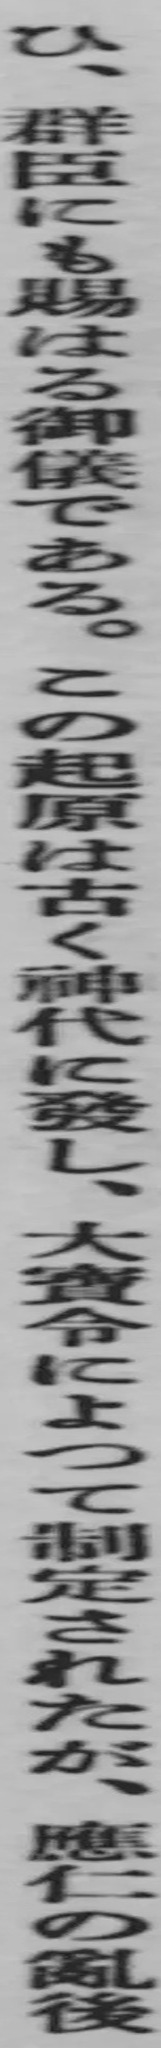ひ、群臣にも賜はる御儀である。この起原は古く神代に發し、大寶令によつて制定されたが、應仁の亂後
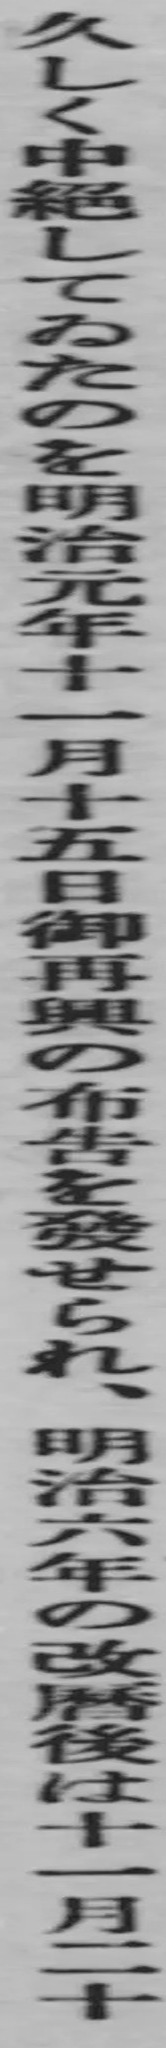久しく中絕してゐたのを明治元年十一月十五日御再興の布告を發せられ、明治六年の改曆後は十一月二十
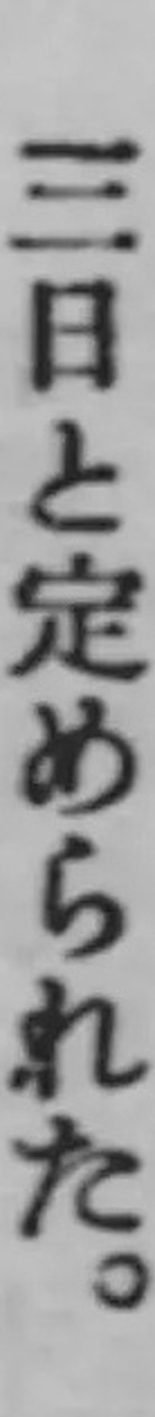三日と定められた。
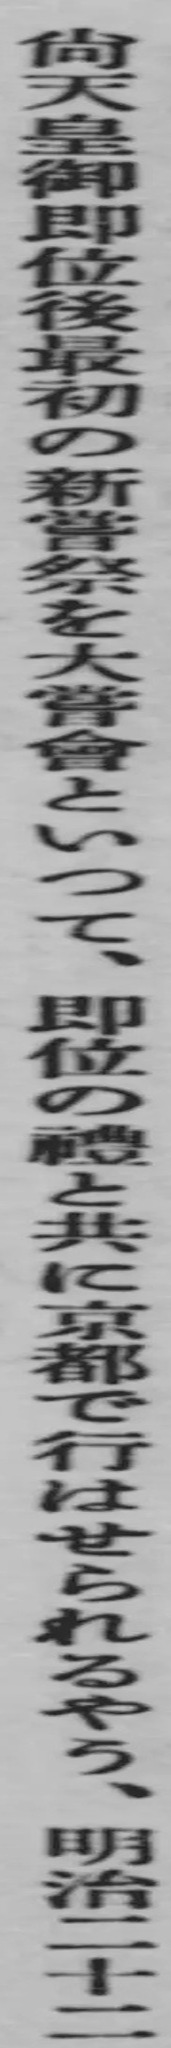尚天皇御即位後最初の新嘗祭を大嘗會といつて、即位の體と共に京都で行はせられるやう、明治二十二
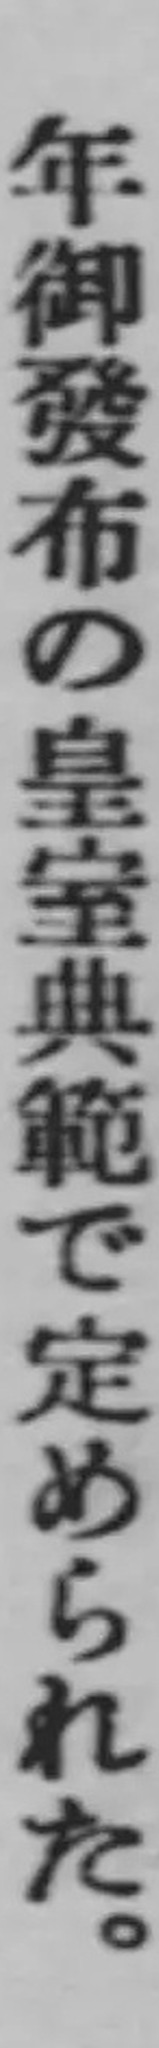年御發布の皇室典範で定められた。
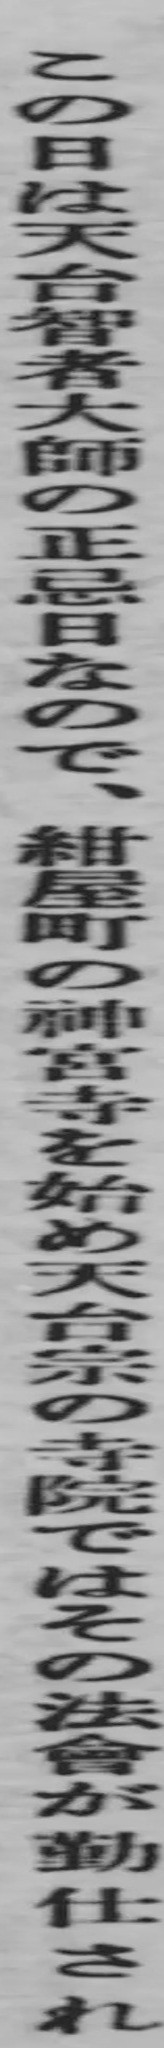この日は天台智者大師の正忌日なので、紺屋町の神宮寺を始め天台宗の寺院ではその法會が勤仕され
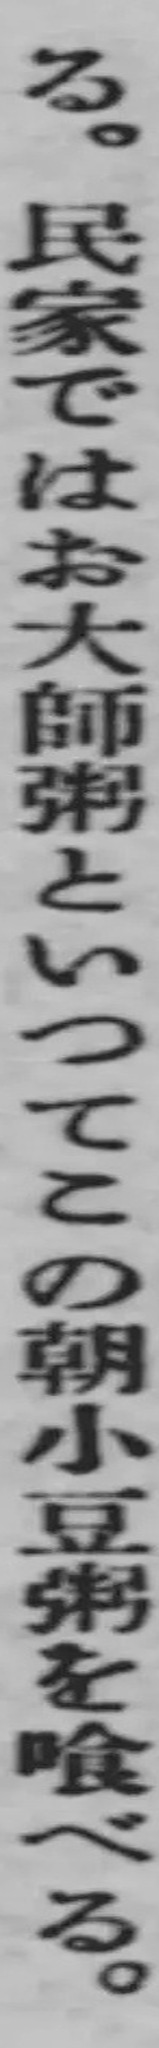る。民家ではお大師粥といつてこの朝小豆粥を喰べる。
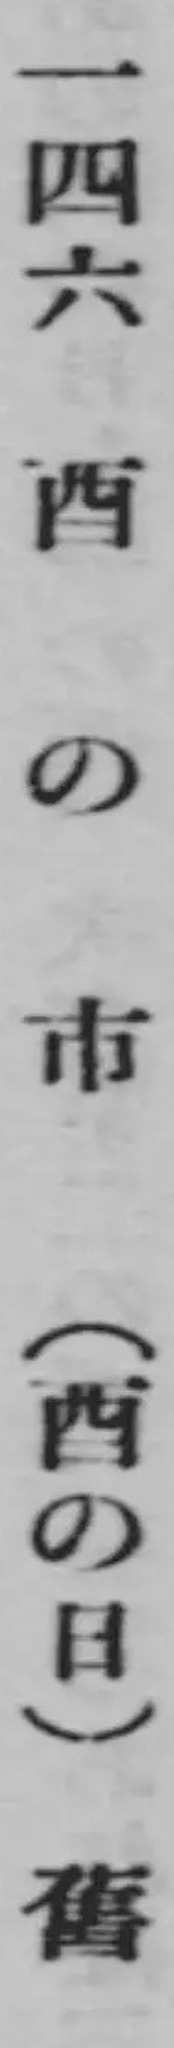一四六酉の市(酉の日)舊

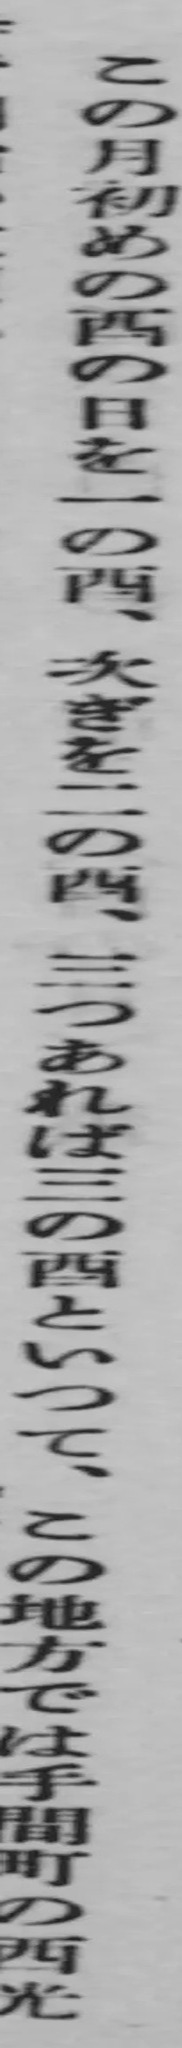この月初めの酉の日を一の酉、次ぎを二の酉、三つあれば三の酉といつて、この地方では手間町の西光
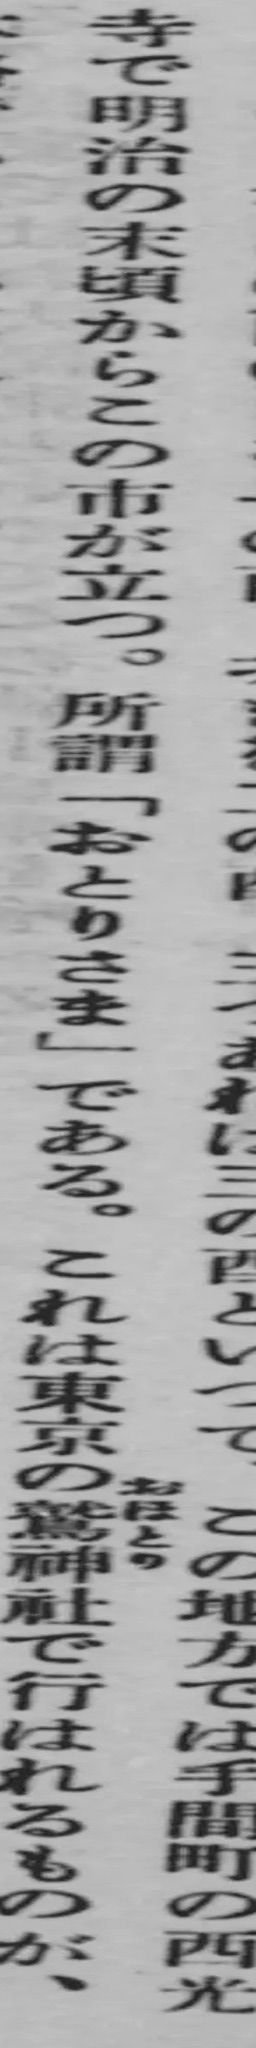寺で明治の末頃からこの市が立つ。所謂「おとりさま」である。これは東京の鷲神社で行はれるものが、
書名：豊橋の年中行事
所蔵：国立国会図書館 National Diet Library, JAPAN
